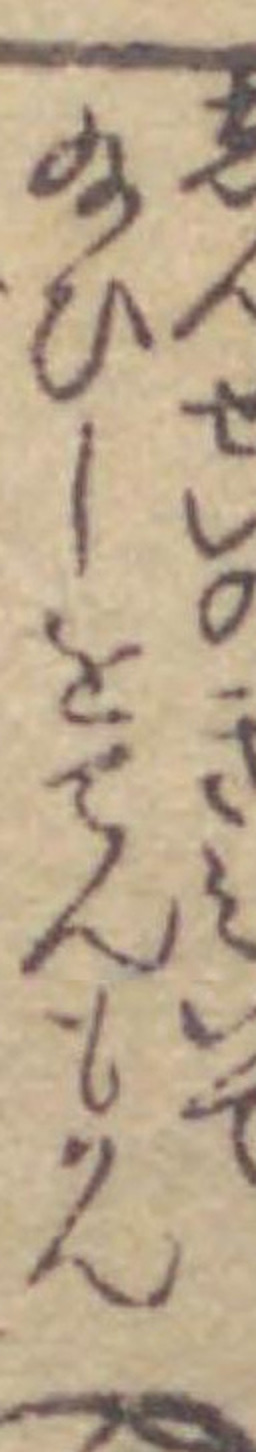給ひしをてんもかん
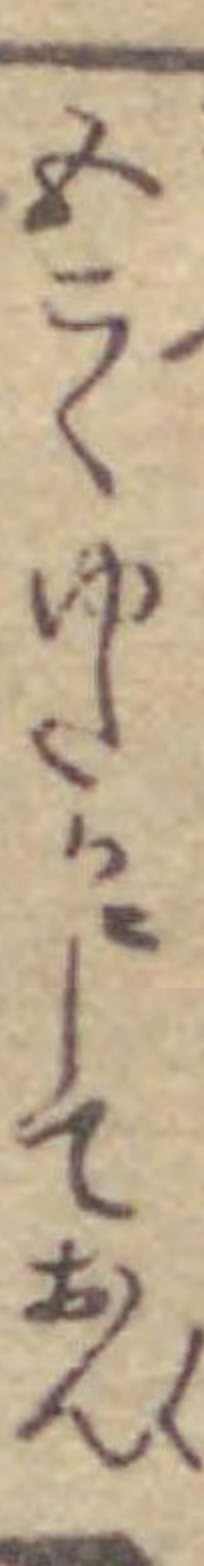五こくゆたかにしておん
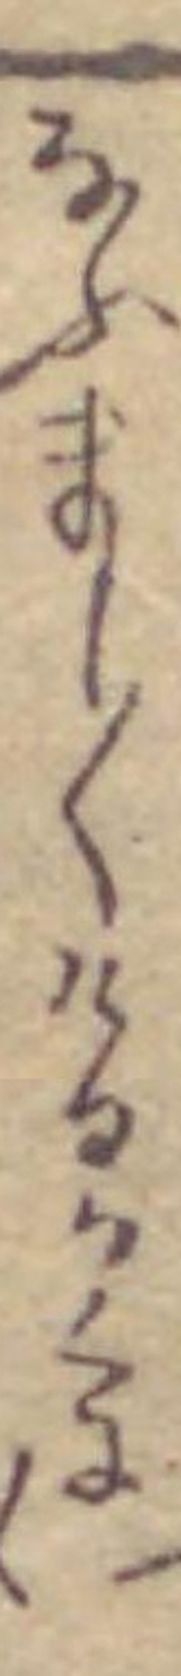なふまし〳〵けるかくに
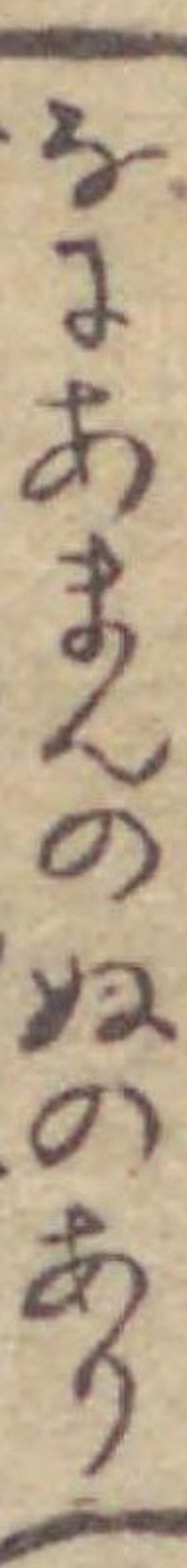なにあまんのぬのあり
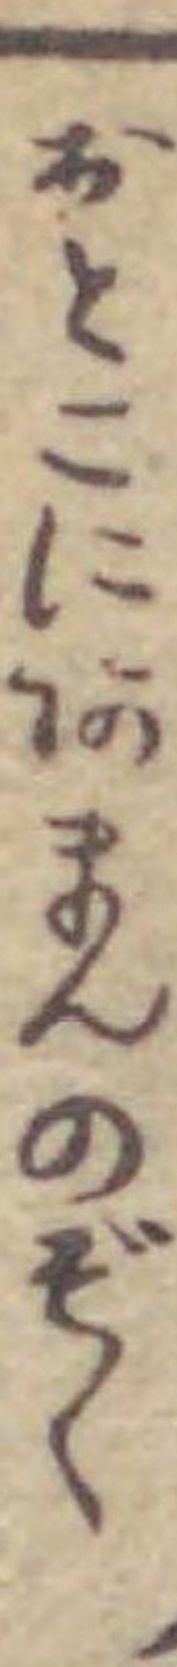おとこにあまんのぞく
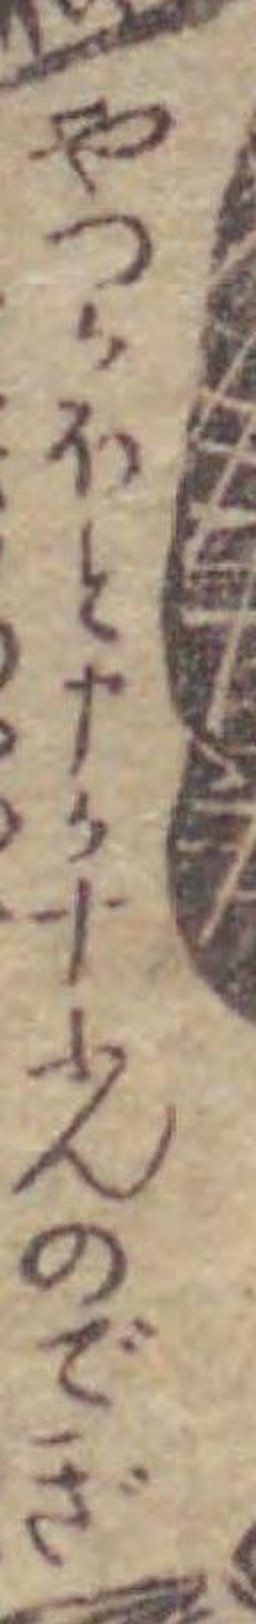やつかほと申か十ふんのでき
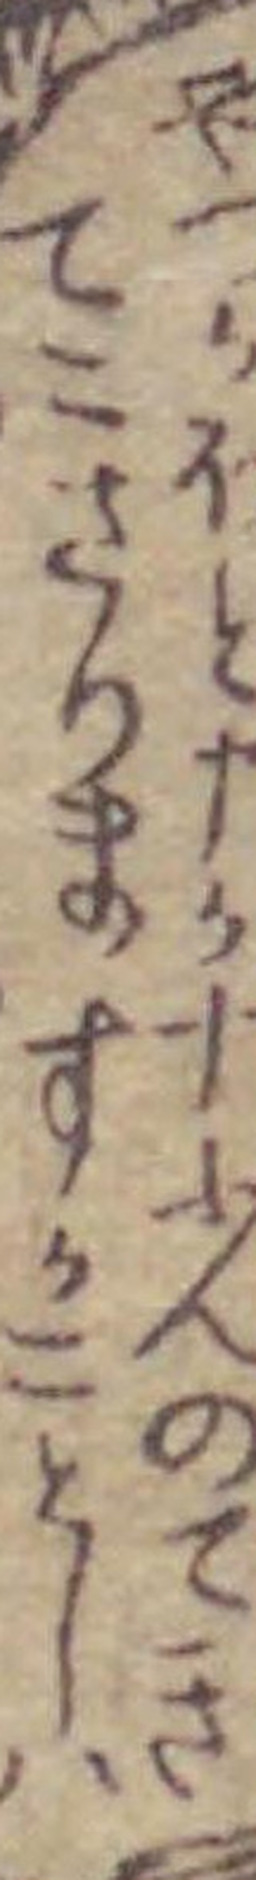てこさりますかことしは
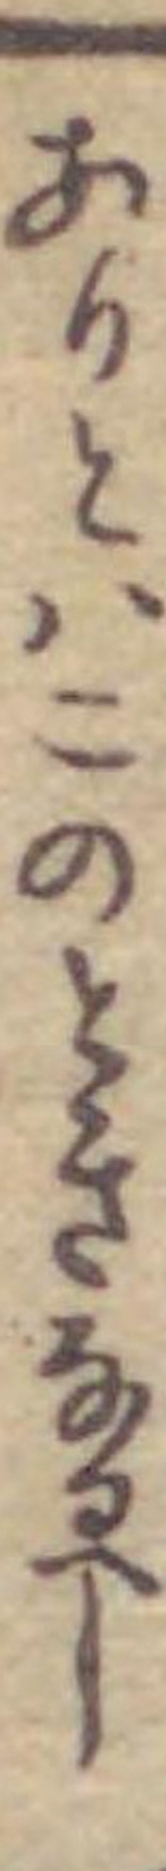ありとはこのときなるべし
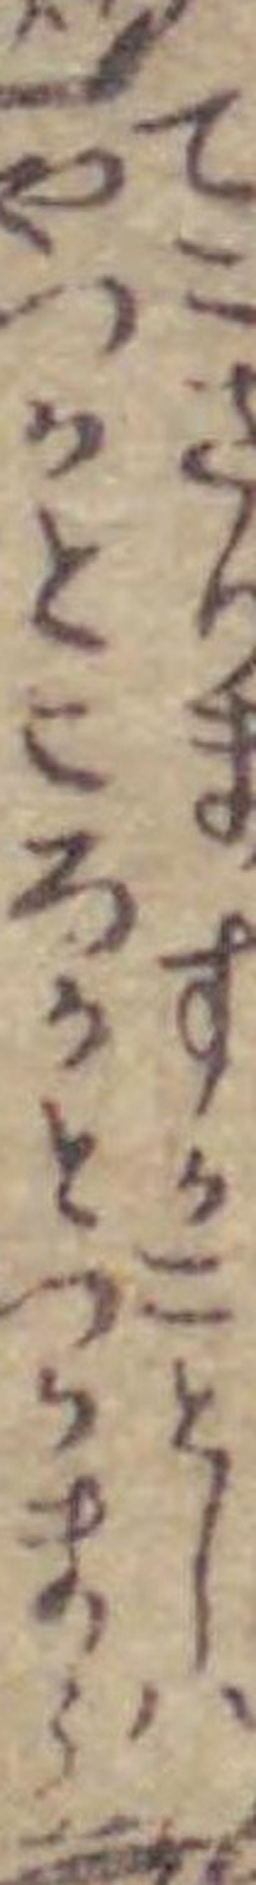やつかところかとつかまら
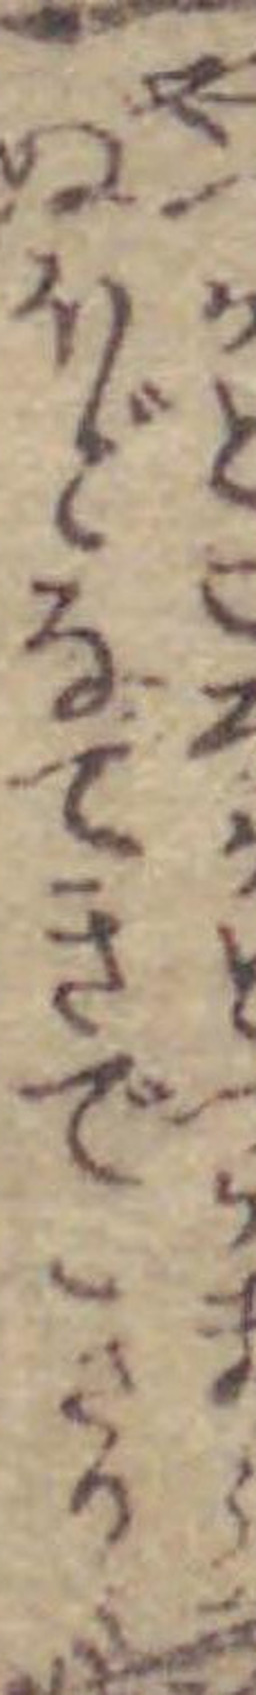ぬほどなできでこさり
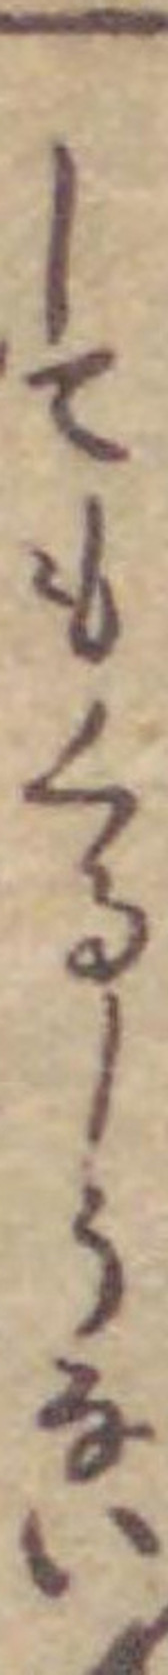してもくるしうない
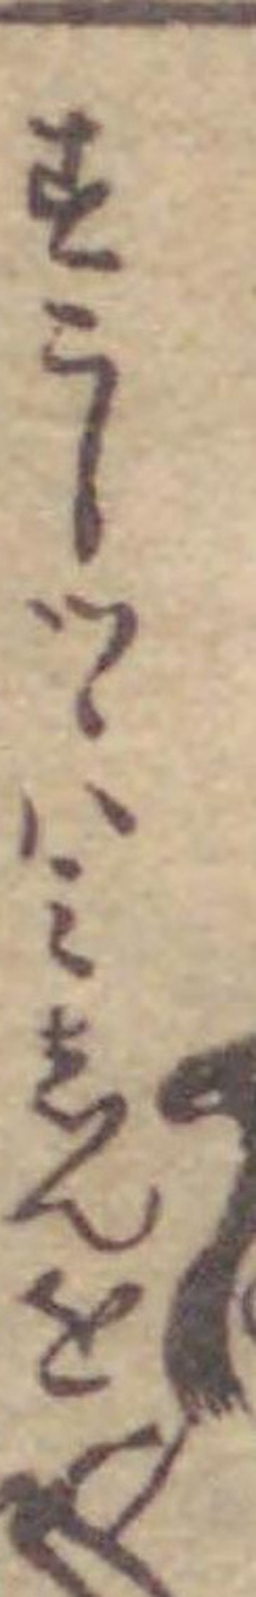すこしつゝはみしんを
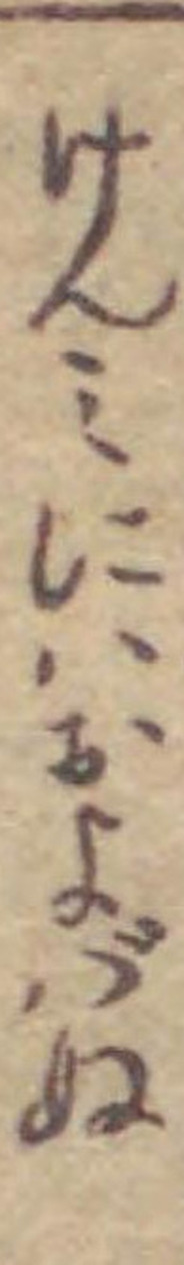けんみにはおよばぬ

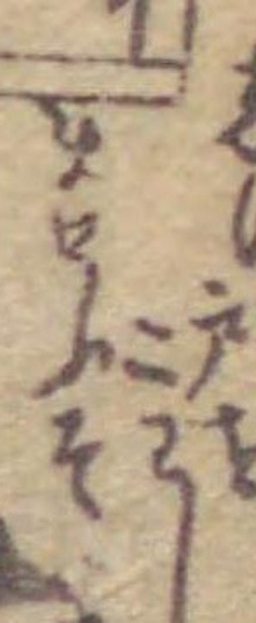ませふそ
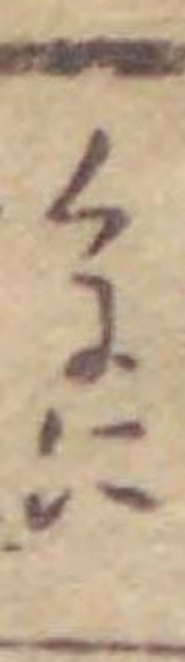くにに
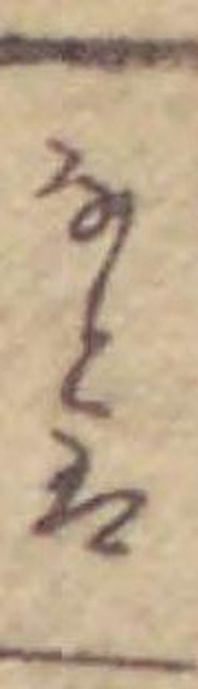なとは
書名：天下一面鏡梅鉢 : 3巻
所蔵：国立国会図書館 National Diet Library, JAPAN
